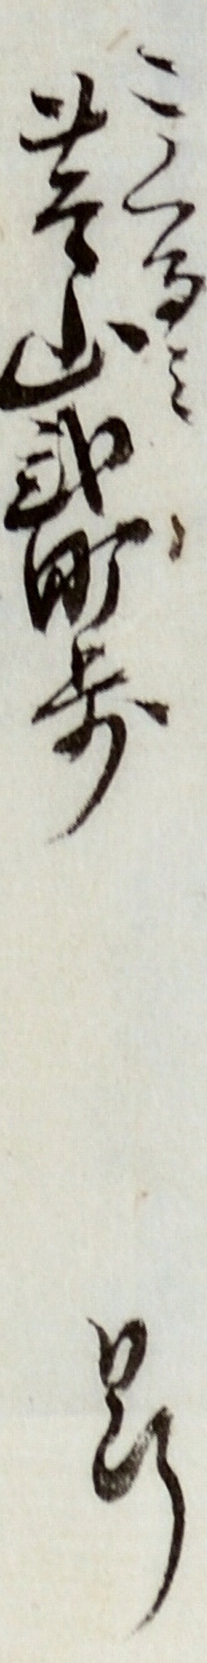芝山弐町歩同断
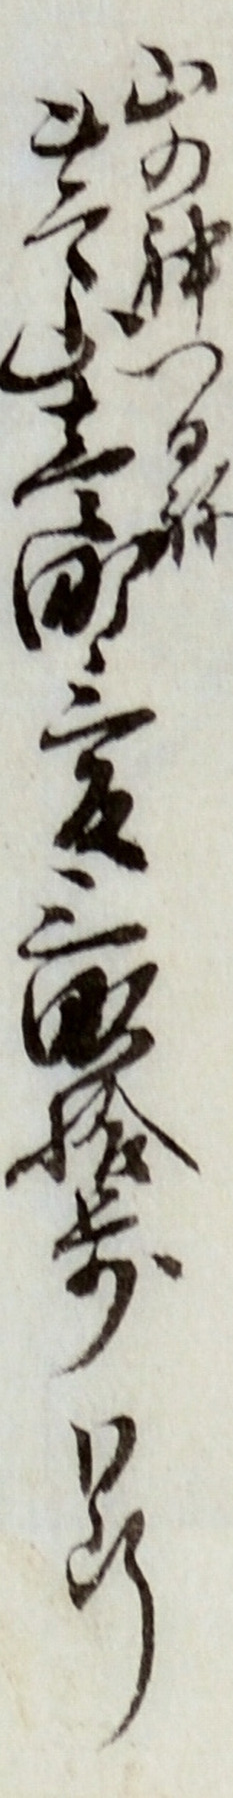芝山壱町三反三畝拾歩同断
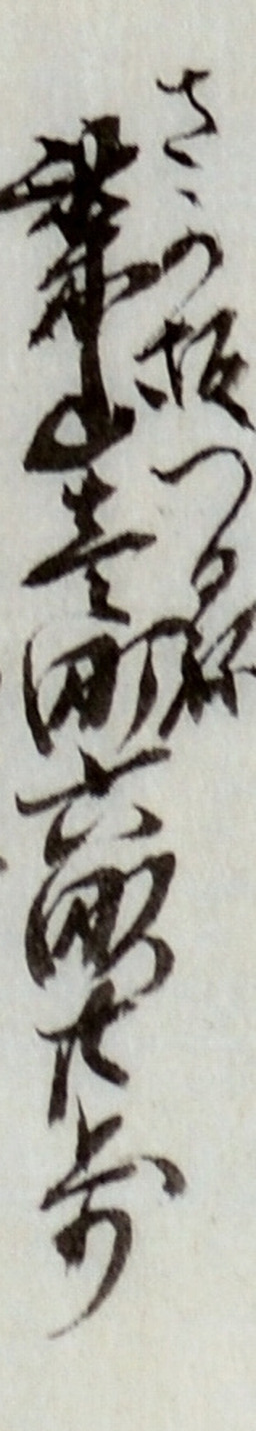柴山壱町六畝廿歩同断
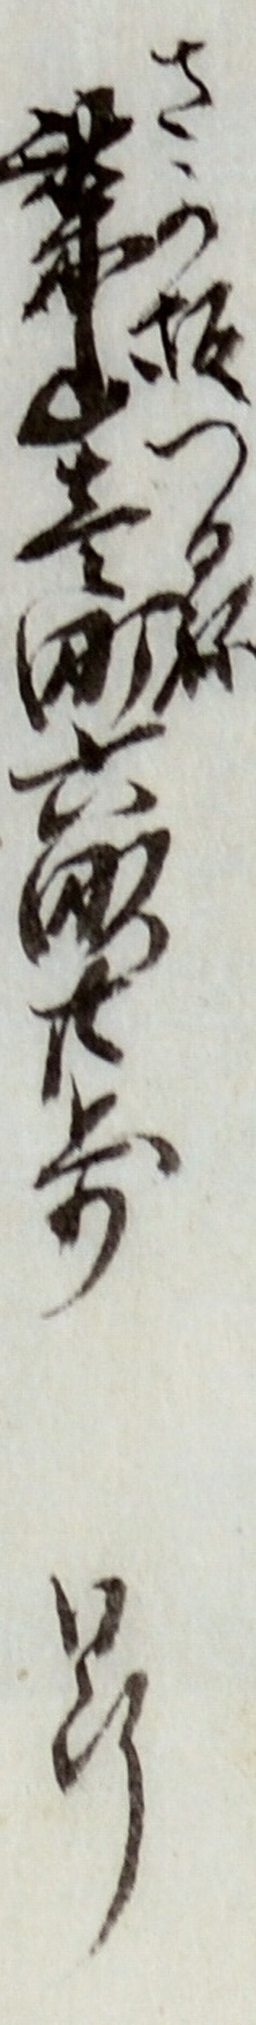柴山壱町六畝廿歩同断
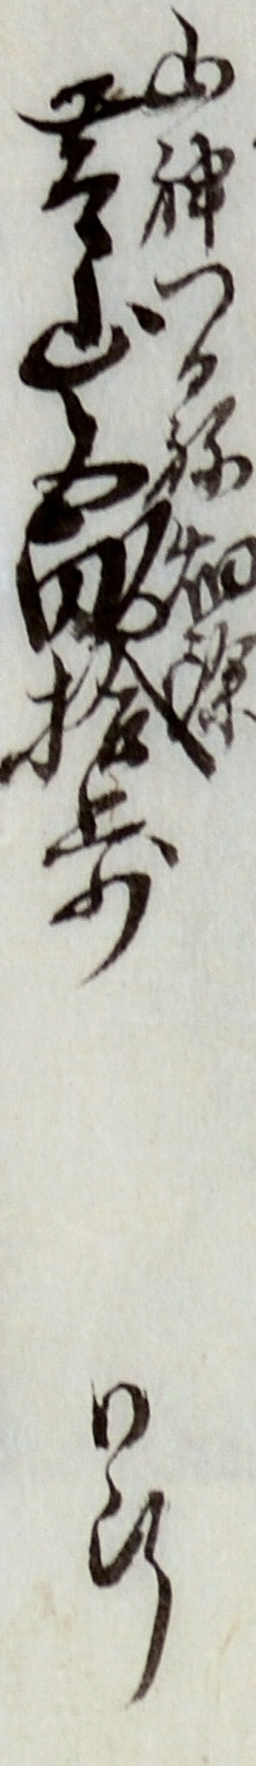芝山五畝拾歩同断

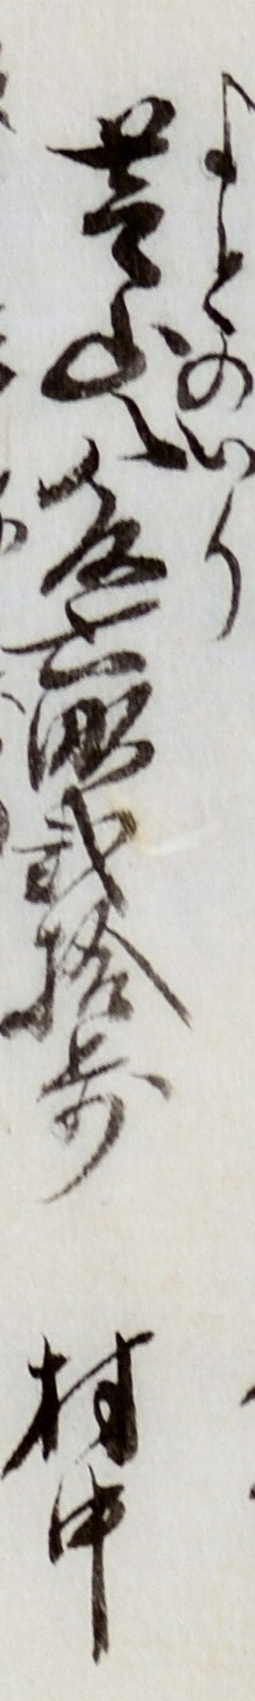芝山八反六畝弐拾歩村中
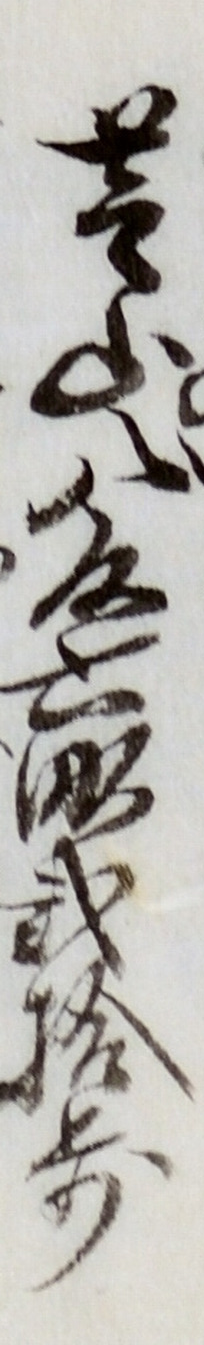芝山八反六畝弐拾歩村中
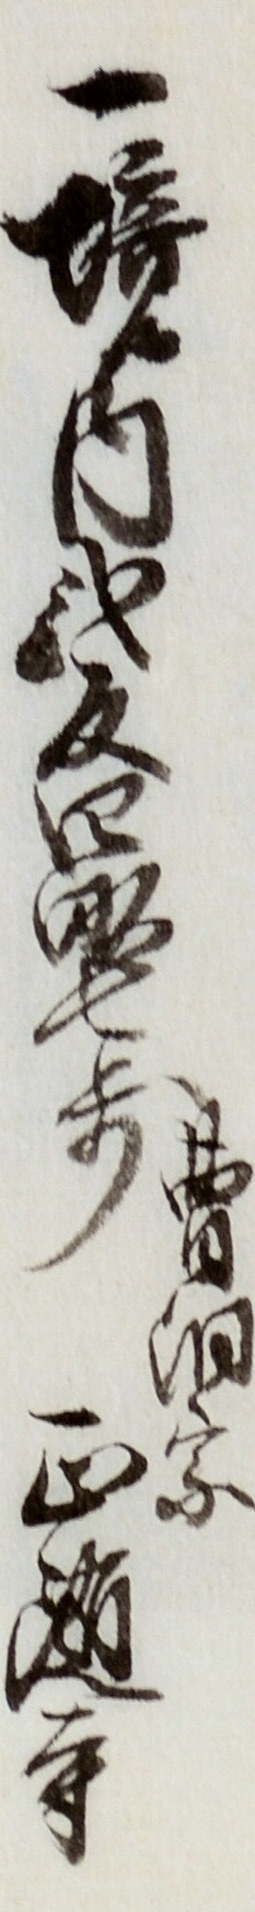一境内弐反四畝七歩正随寺
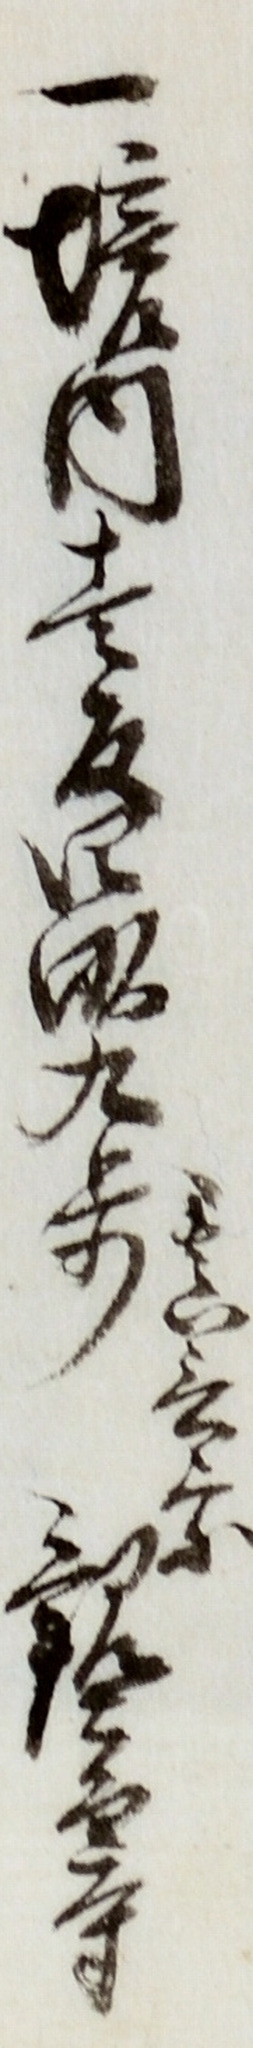一境内壱反四畝九歩観音寺
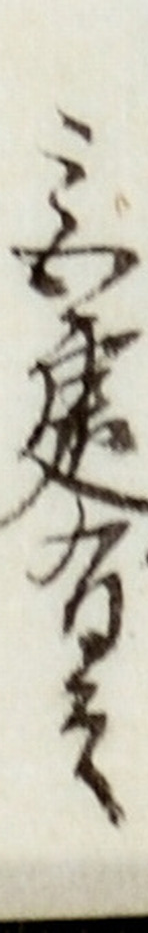宮建有之
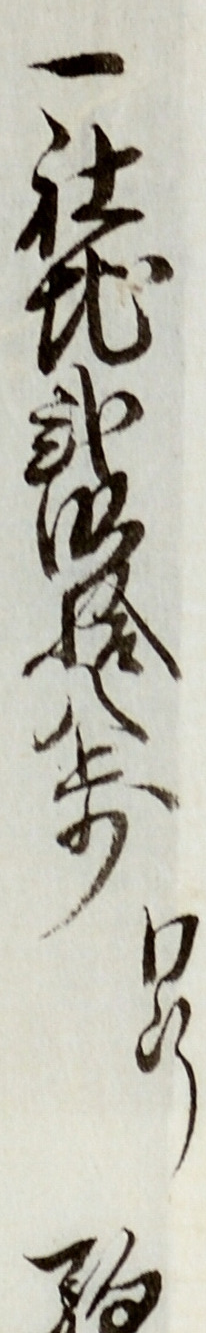一社地弐畝拾八歩駒形
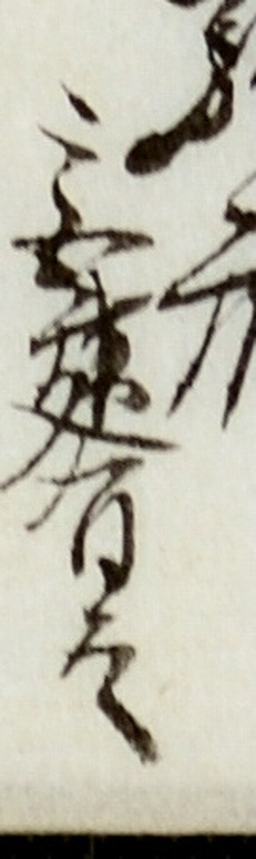宮建有之
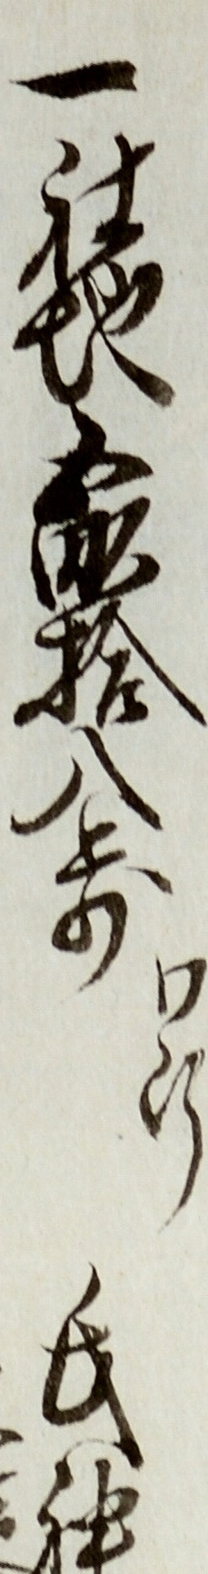一社地五畝拾八歩氏神
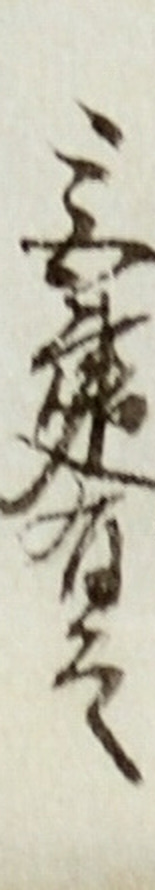宮建有之
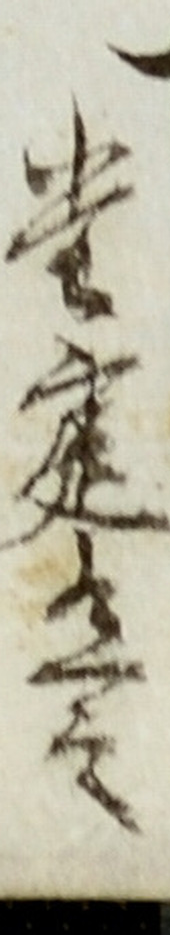堂建有之
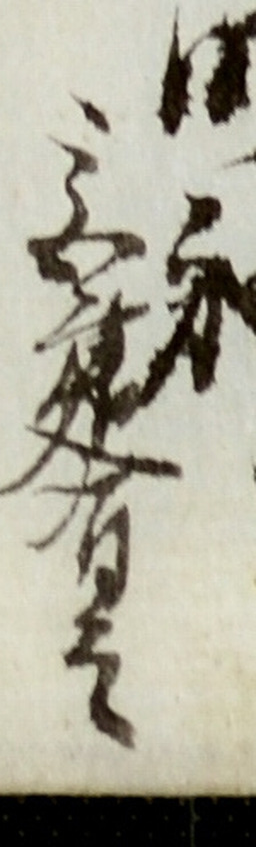宮建有之
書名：御領分中山林社地手控
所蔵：伊那市立高遠町図書館・合同会社AMANE
